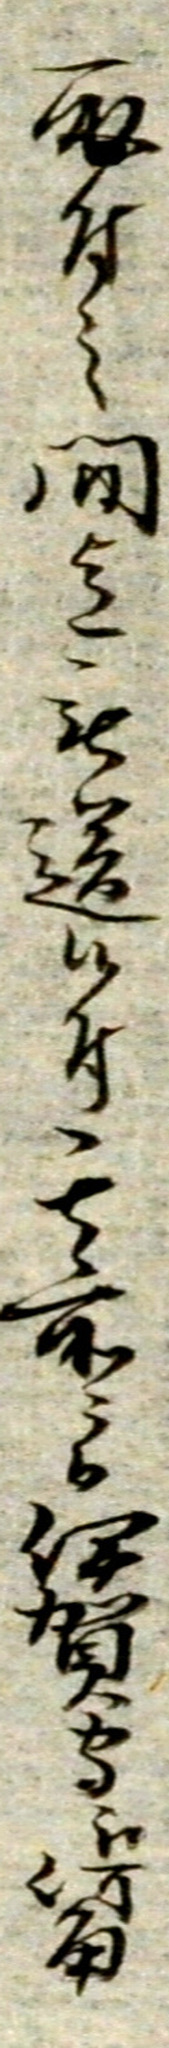取付之間迄被送候付其所ニ而伊賀守江何角
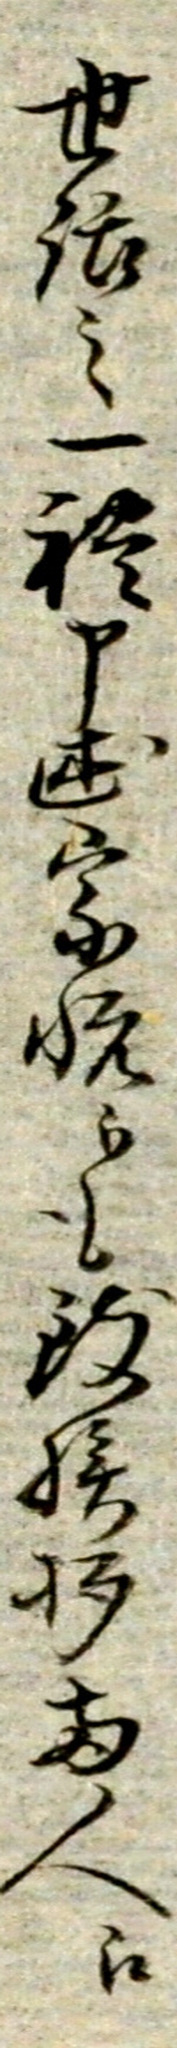世話之一礼申述宗悦江も致挨拶両人江
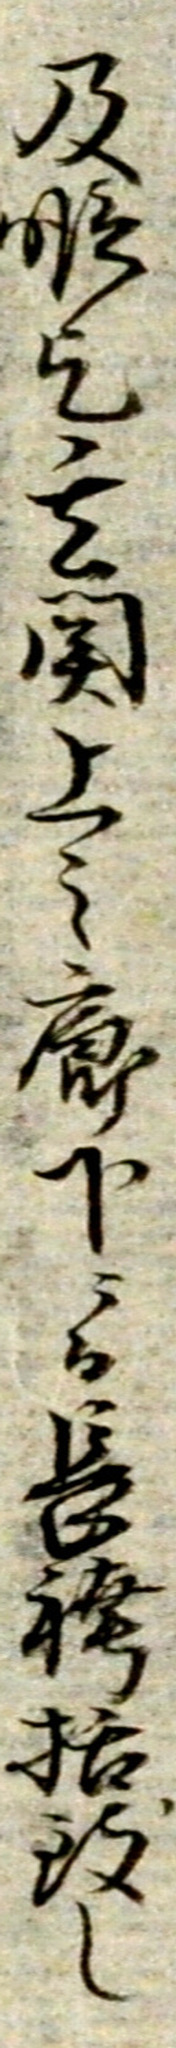及暇乞玄関上之廊下ニ而長袴括致し
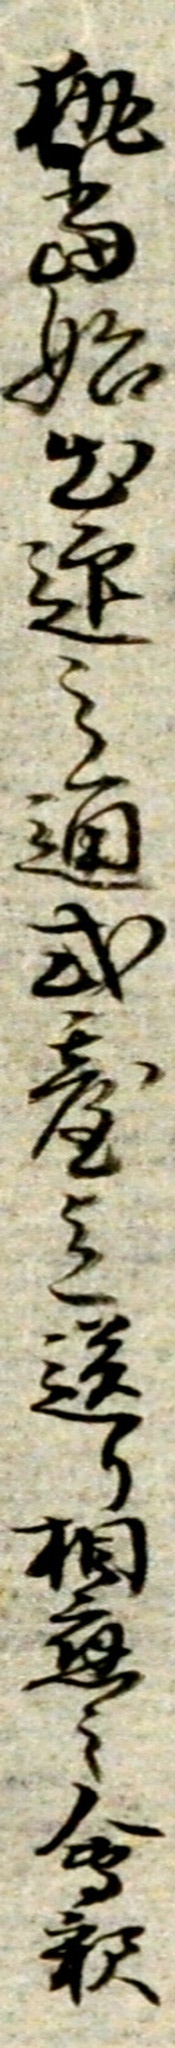執当始出迎之通式台迄送り相応之会釈
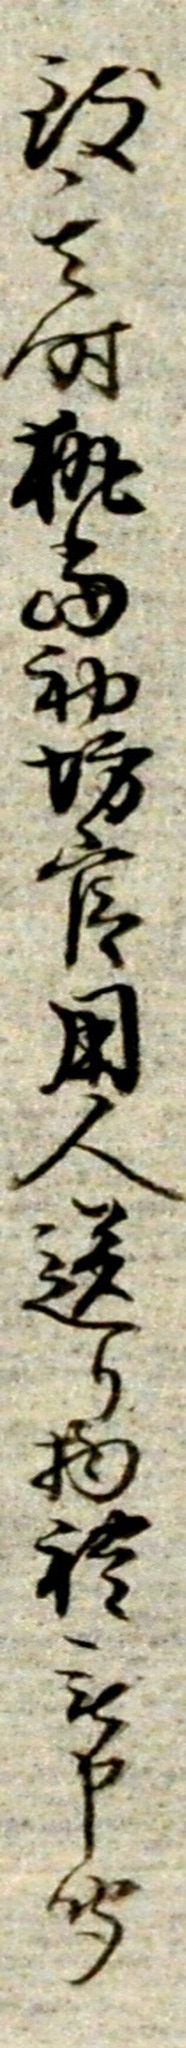致其時執当初坊官用人送り物礼被申聞
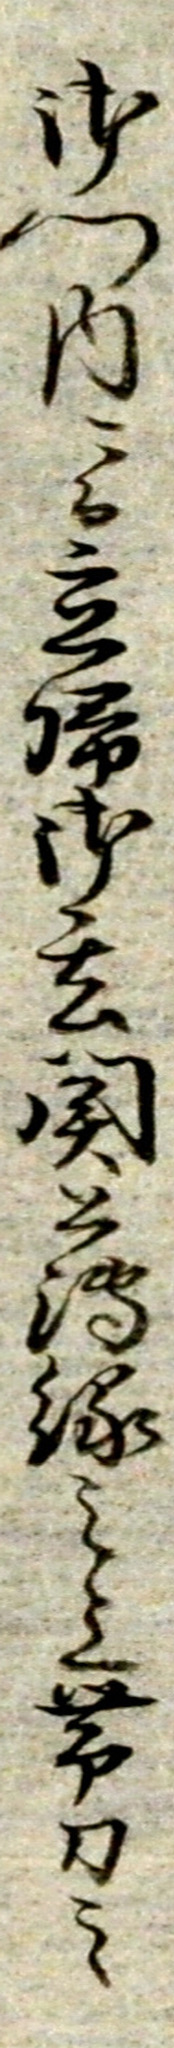御門内ニ而立帰御玄関薄縁之上帯刀之
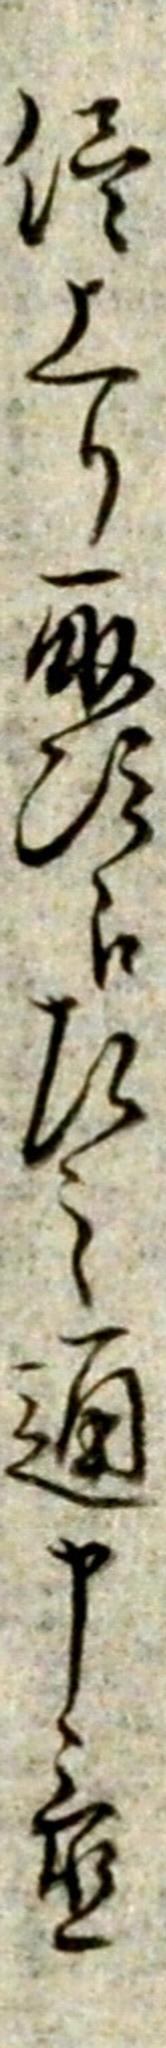儘上り取次江左之通申置
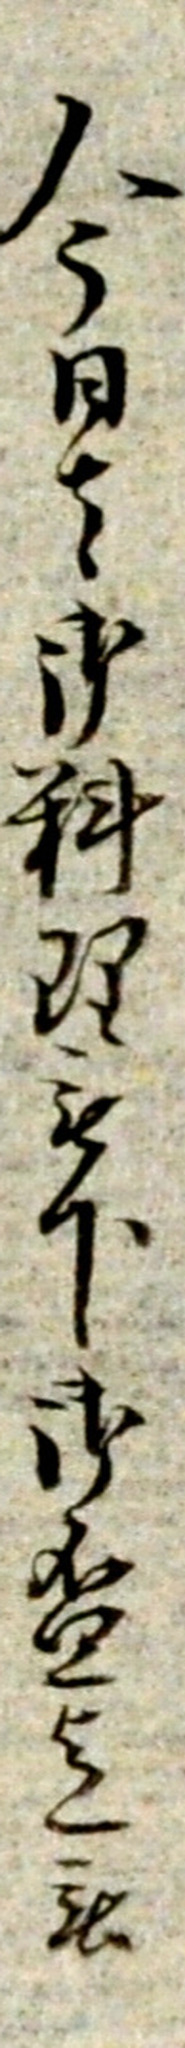今日者御料理被下御盃迄被
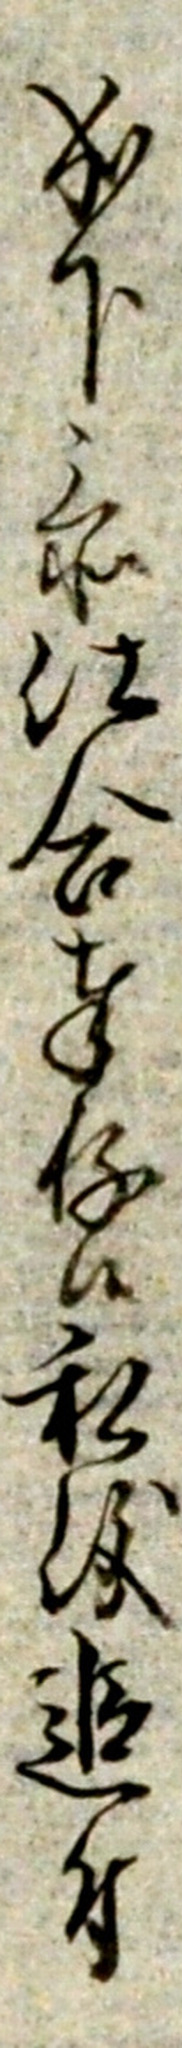成下忝仕合奉存候私儀追付
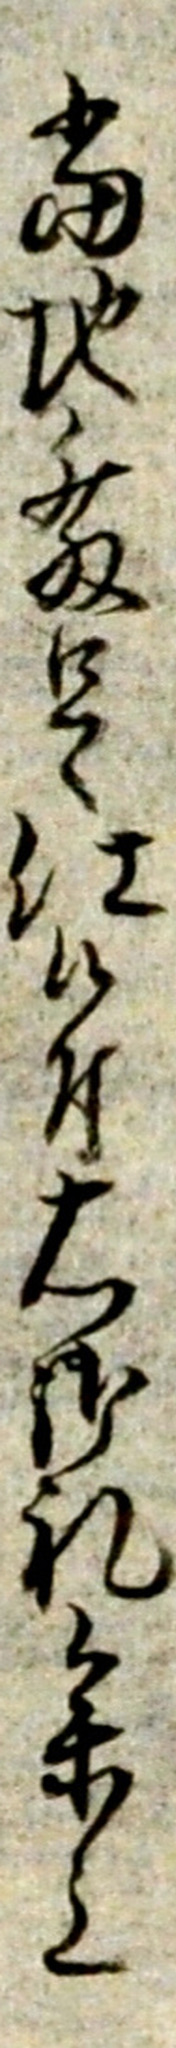当地発足仕候付右御礼参上
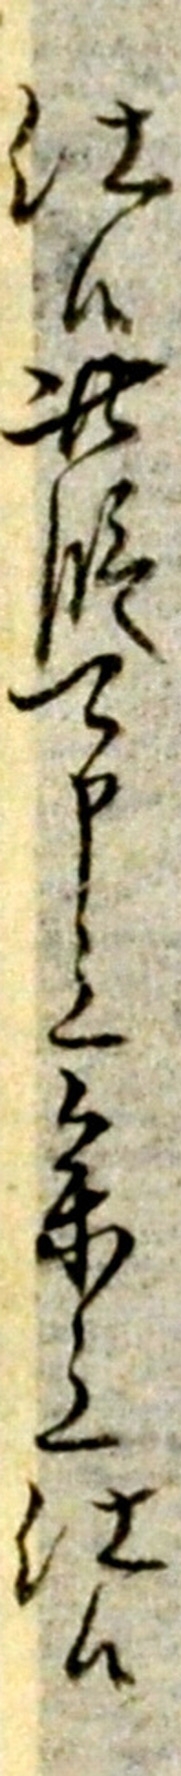仕候此段可申上参上仕候
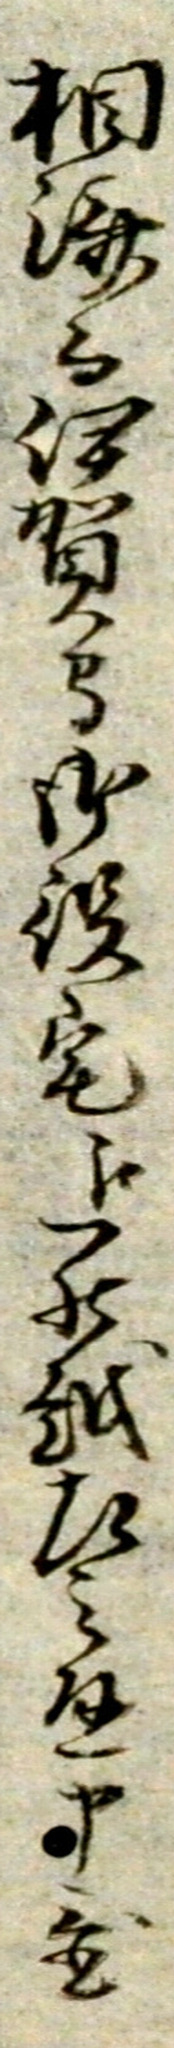相済而伊賀守御役宅江罷越左之通申置
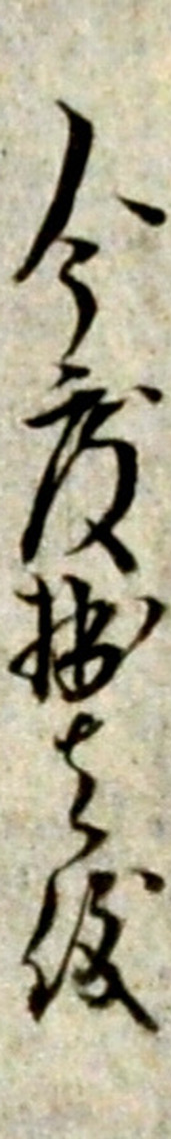今度拙者儀
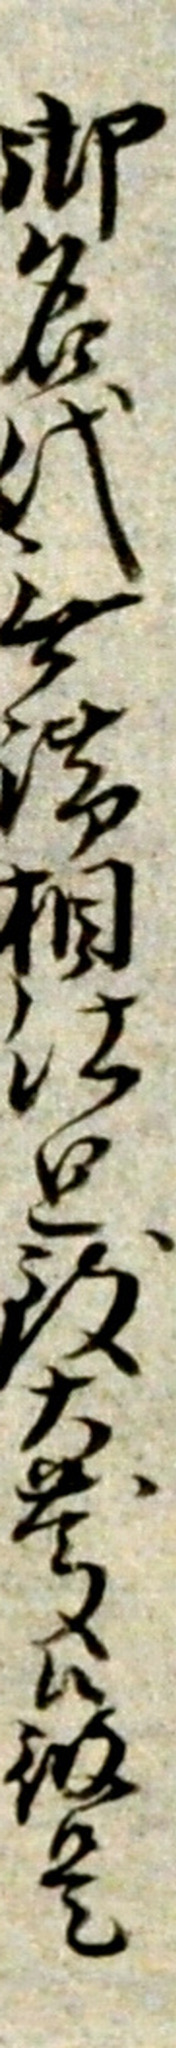御名代無滞相仕且致大慶候彼是

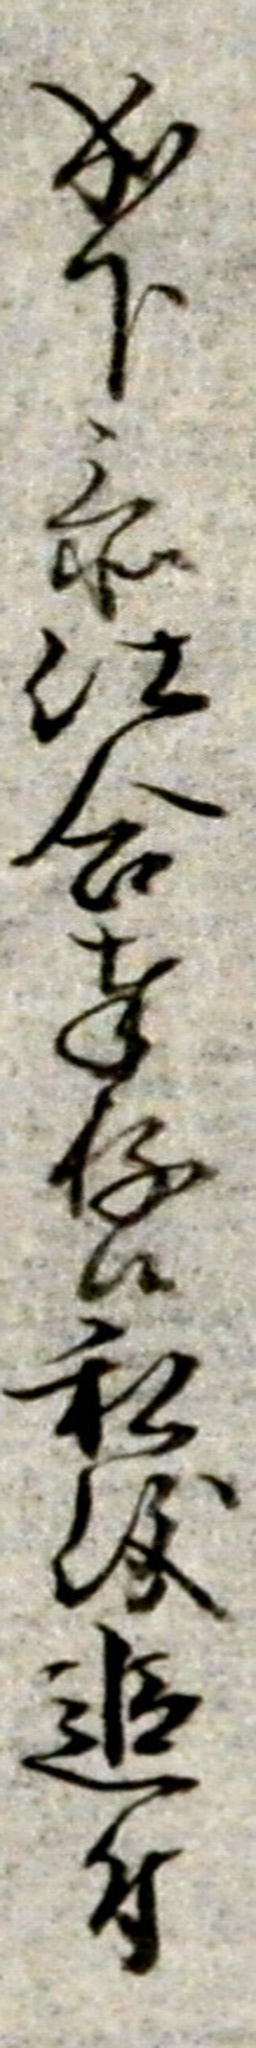成下忝仕合奉存候私儀追付
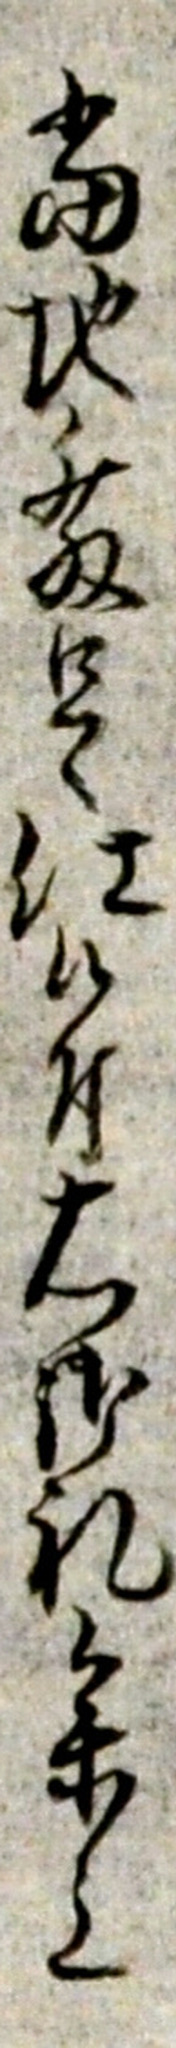当地発足仕候付右御礼参上
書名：日光御名代相勤候節ノ留
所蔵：伊那市立高遠町図書館・合同会社AMANE
